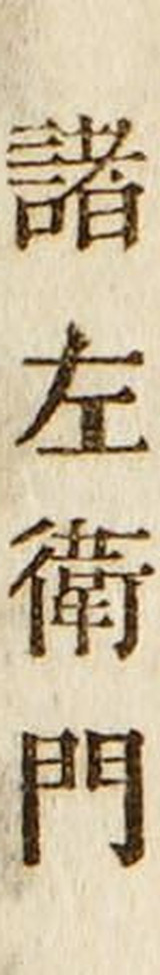彦左衛門
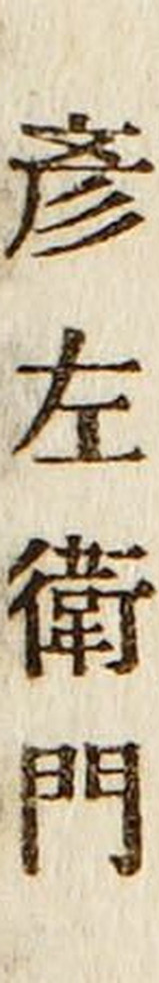彦左衛門
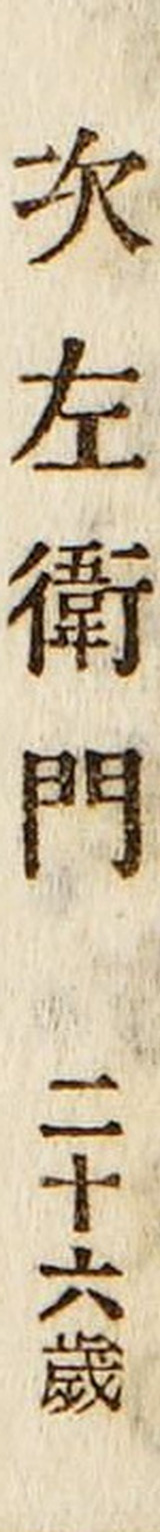右衛門二十八歳
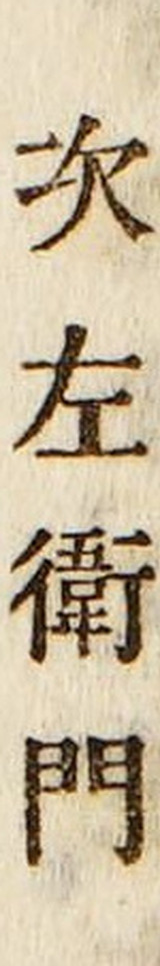彦左衛門
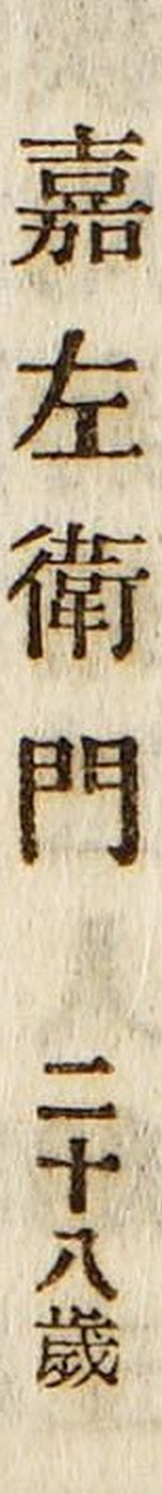右衛門二十八歳
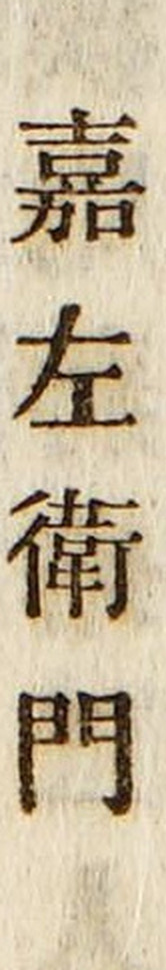彦左衛門
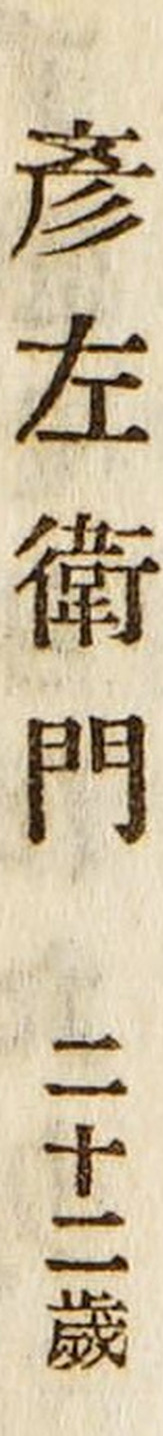右衛門二十八歳
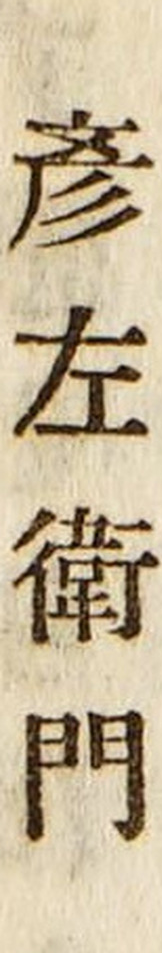彦左衛門
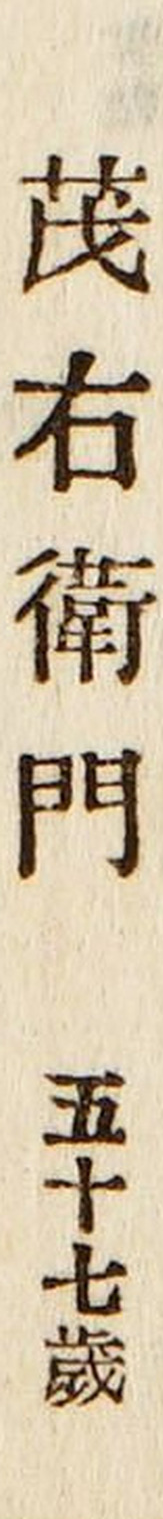右衛門二十八歳
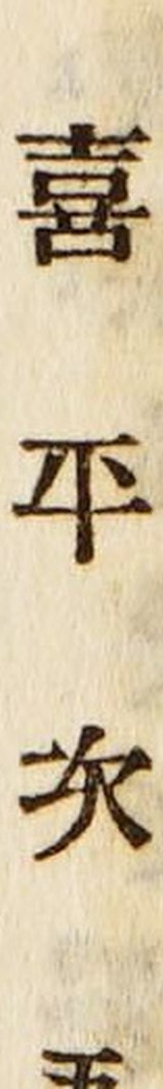与平次
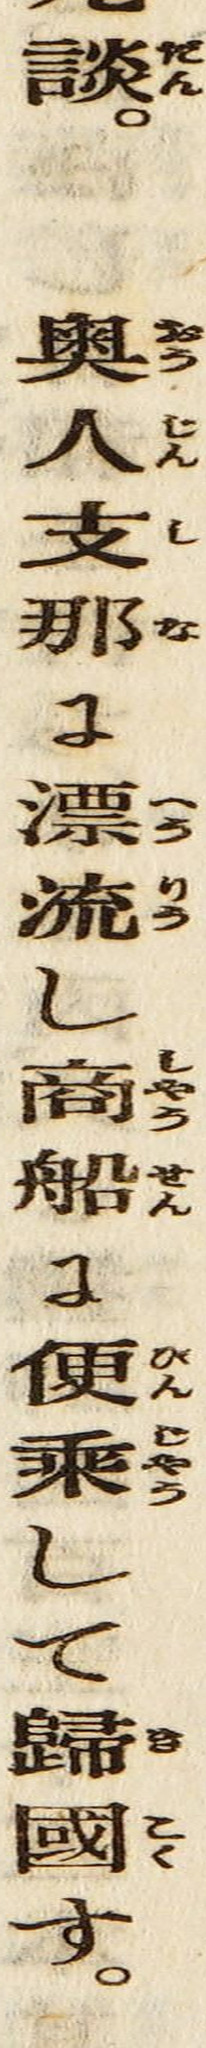第九談。奥人支那に漂流し商船に便乗して帰国す。
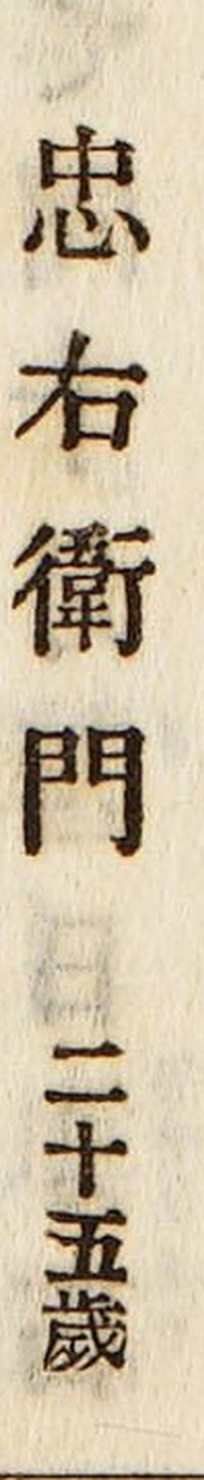右衛門二十八歳
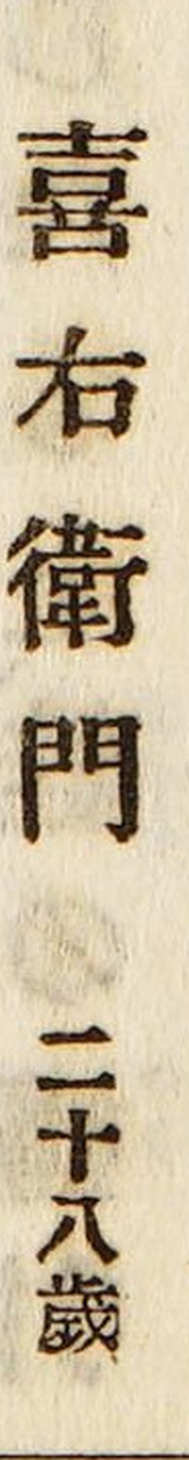右衛門二十八歳

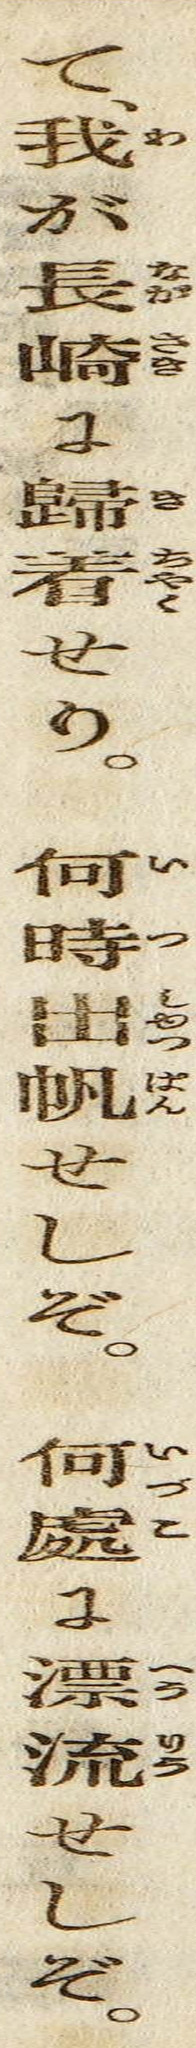て、我が長崎に帰着せり。何時出帆せしぞ。何処に漂流せしぞ。
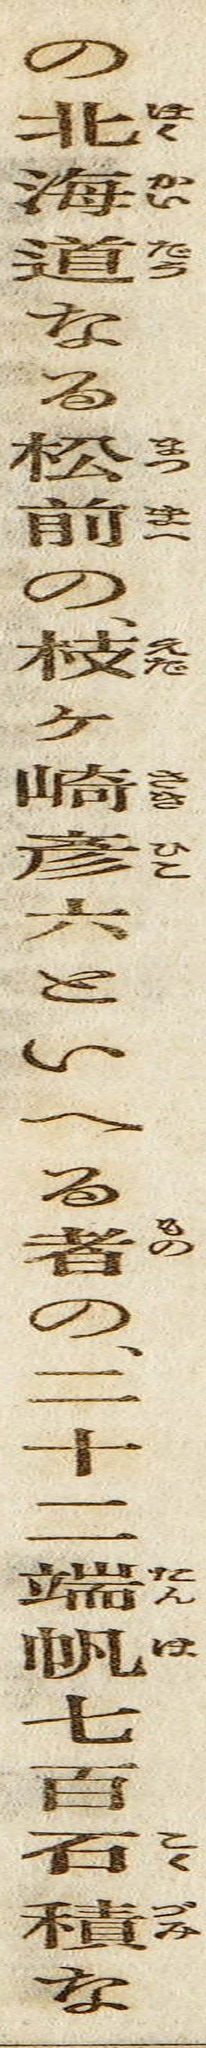の北海道なる松前の、枝ケ崎彦六といへる者の、二十二端帆七百石積な
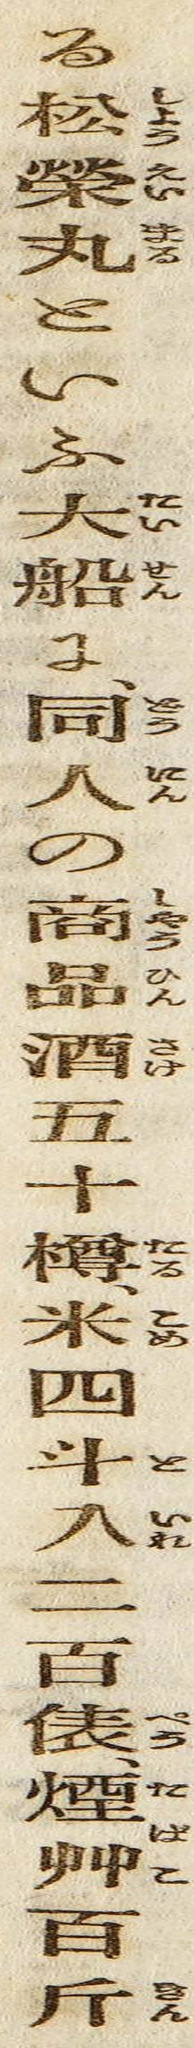る松栄丸といふ大船に同人の商品酒五十樽、米四斗入二百俵、煙草百斤
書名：日本漂流譚
